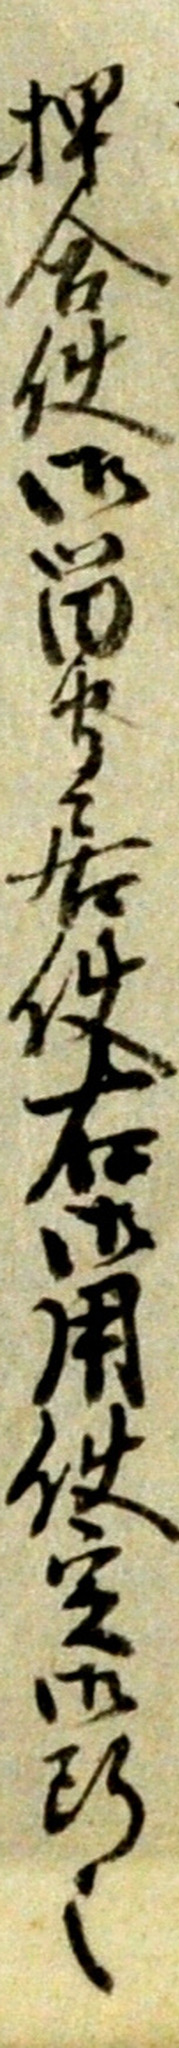押合使御留守居使右御用使定御断之
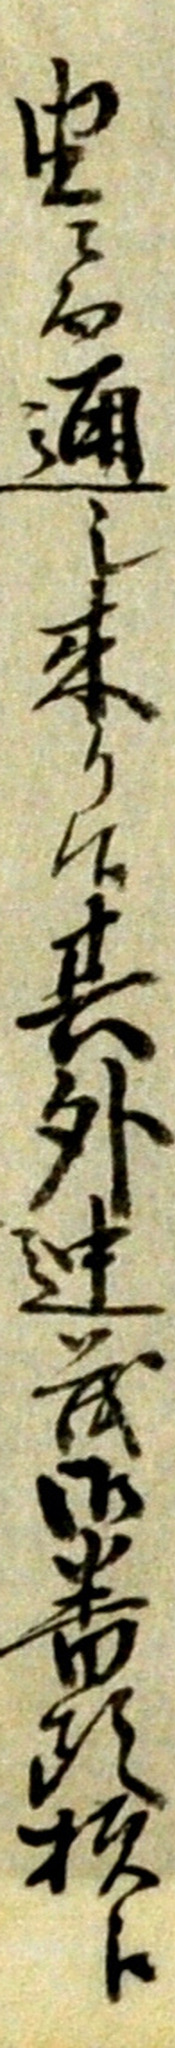由ニ而通シ来り候其外堵ても迚茂御番頭様江
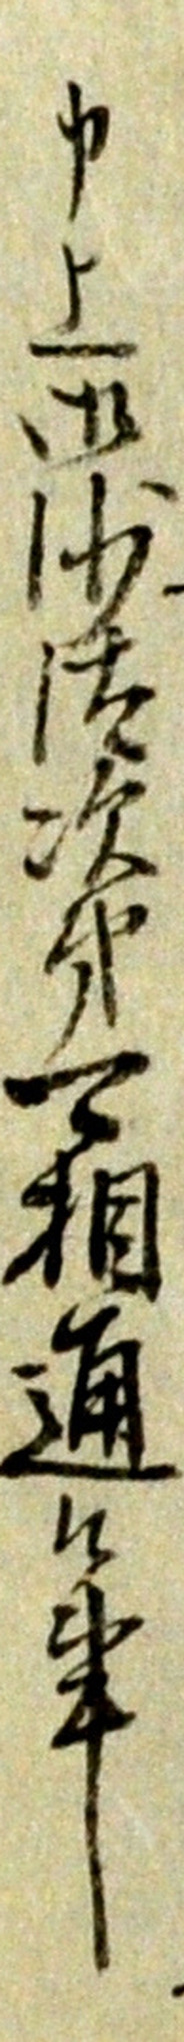申上御沙汰次第可相通候事
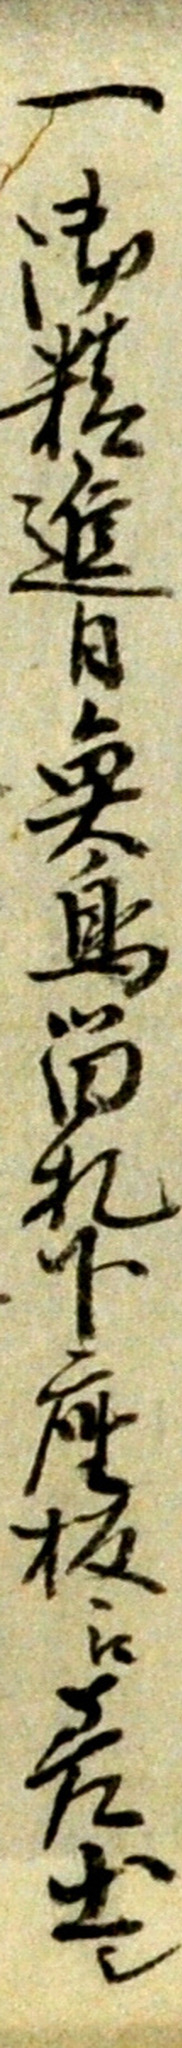一御精進日魚鳥留札下座板江差出シ
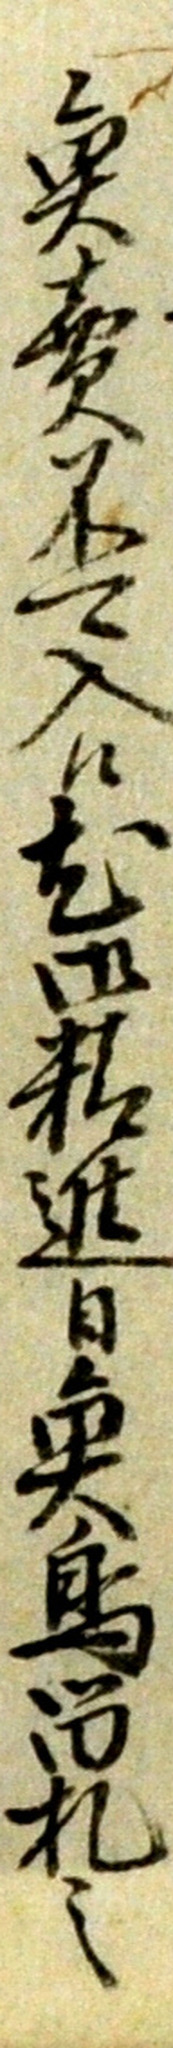魚売不可入候尤御精進日魚鳥留札之
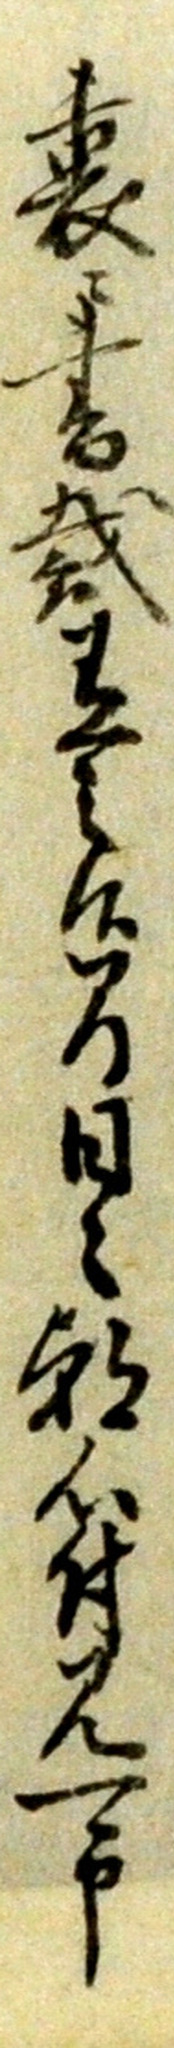裏ニ書載有之候間日々朝心付見可申
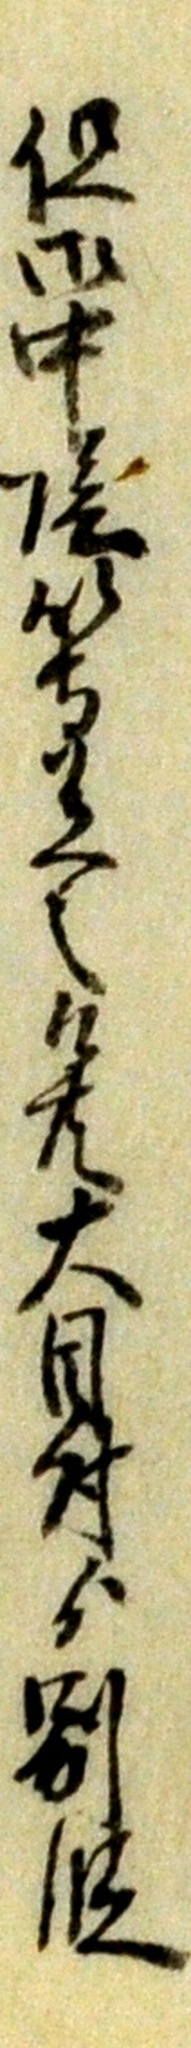但御中陰等有之候共大目付ゟ別段
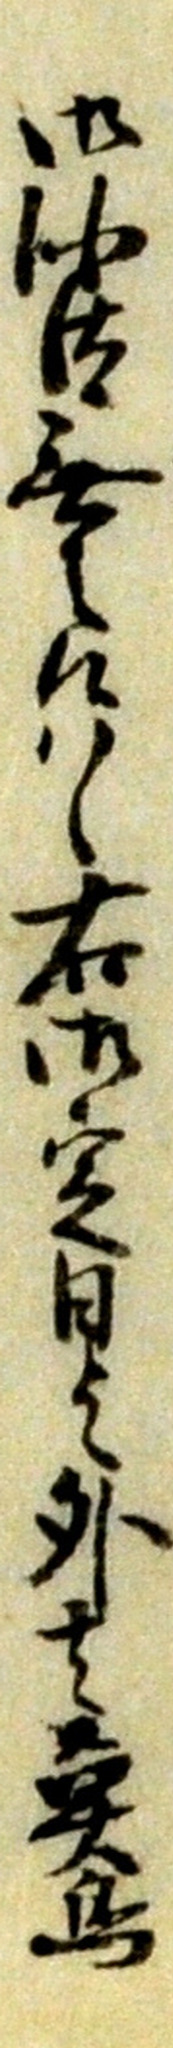御沙汰無之候ハヽ右御定日と外者魚鳥
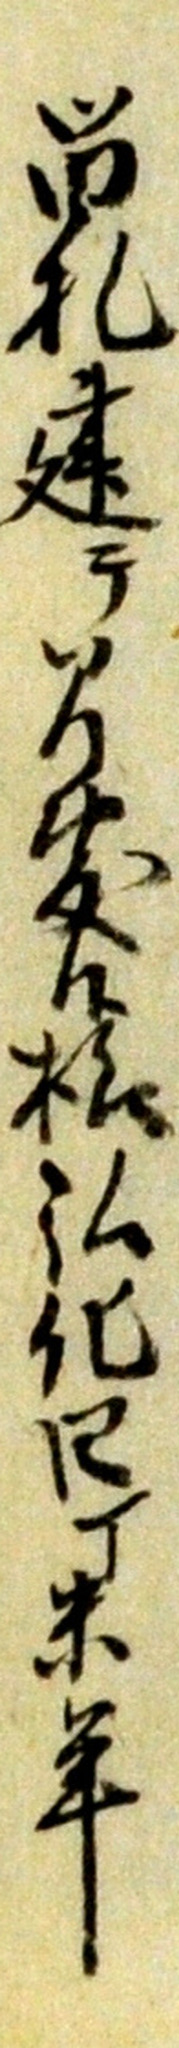留札建テ間敷候様弘化四丁未年
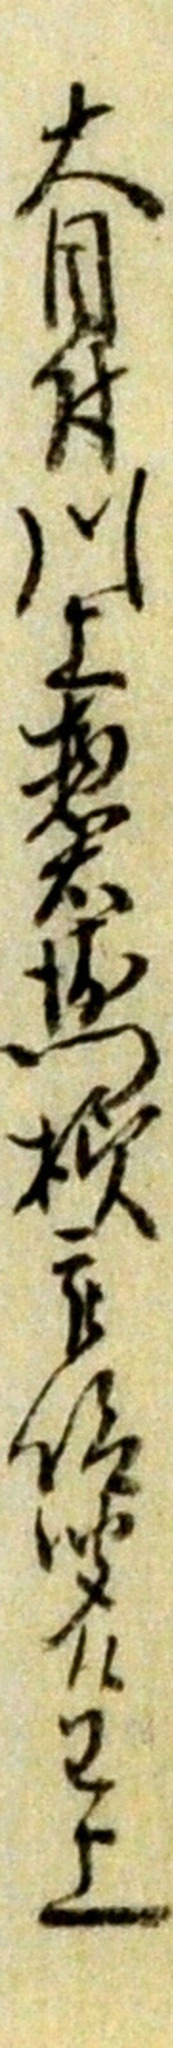大目付川上惣右衛門様被仰聞候已上
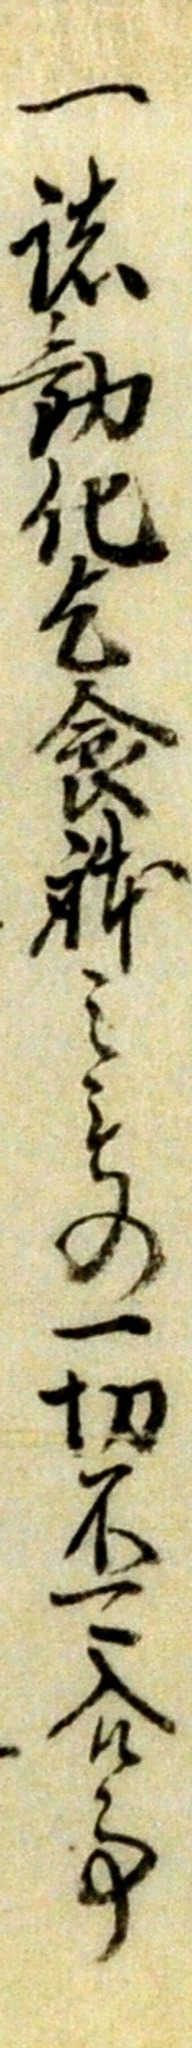一諸勧化乞食体之もの一切不可入候事
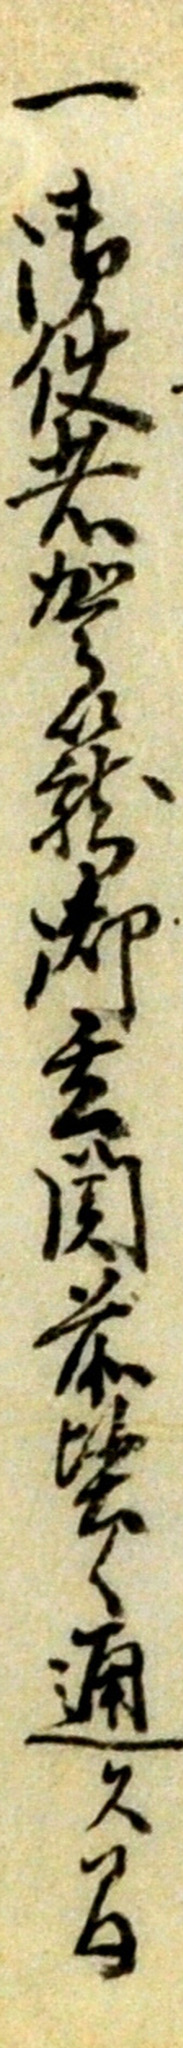一御使者駕籠御玄関前堅く通ス間
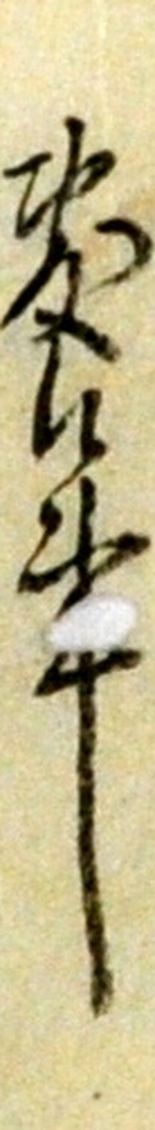敷候事
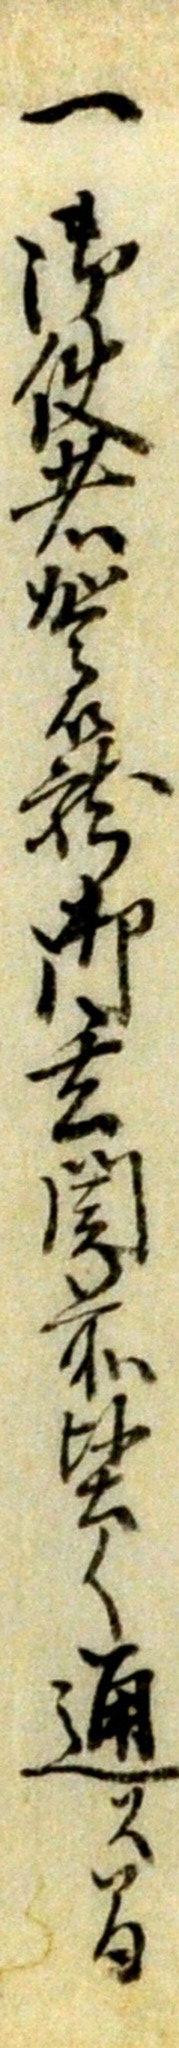一御使者駕籠御玄関前堅く通ス間
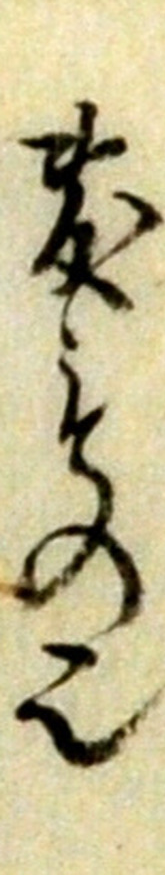敷もの也
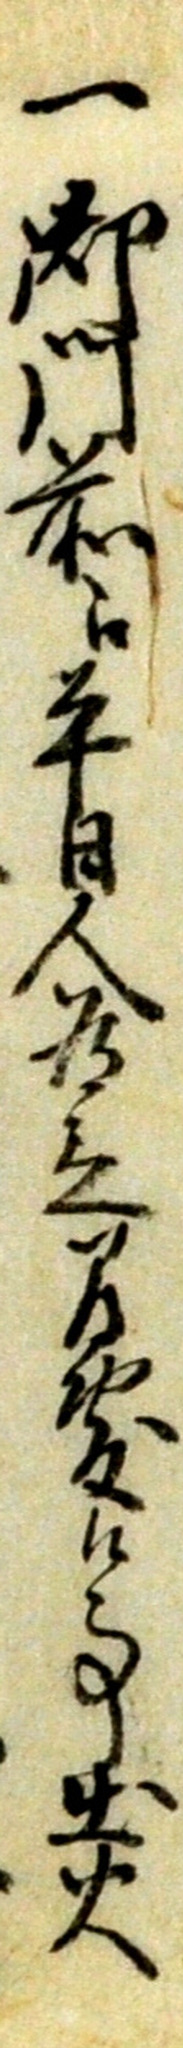一御門前江平日人為立間敷候事出火
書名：御先手組江戸御屋敷御門番勤方
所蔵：伊那市立高遠町図書館・合同会社AMANE
